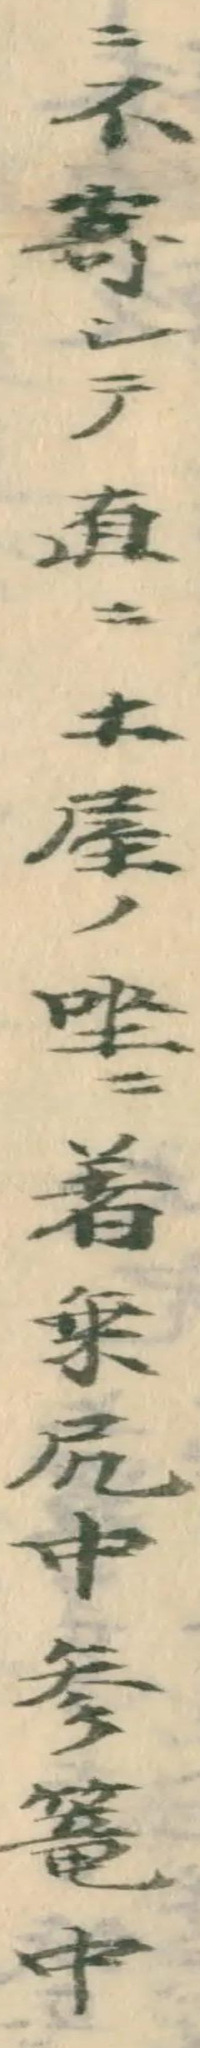ニ不寄シテ直ニ土屋ノ坐ニ着乗尻中参籠中
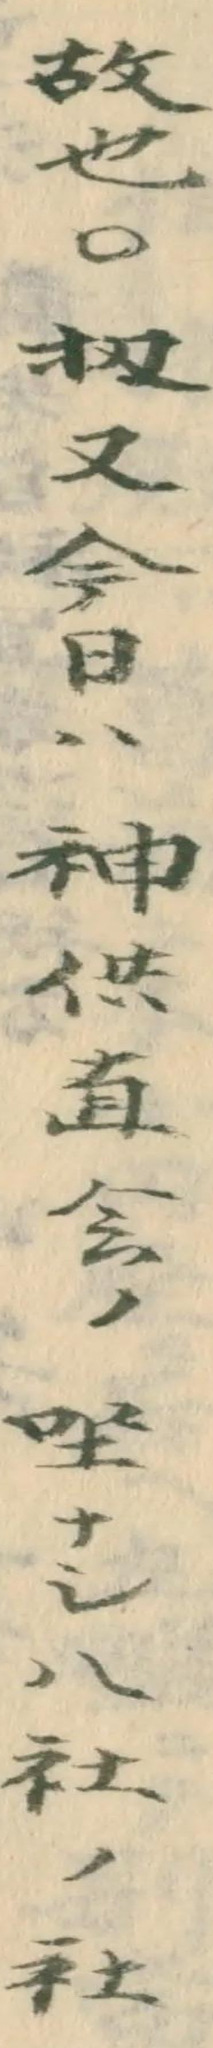故也○扨又今日ハ神供直会ノ坐ナシ八社ノ社
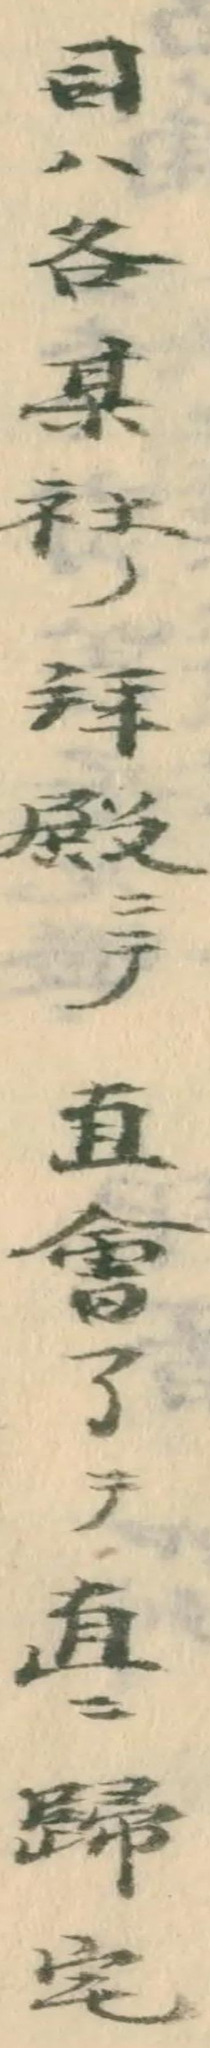司ハ各某社ノ拝殿ニテ直会了テ直ニ帰宅
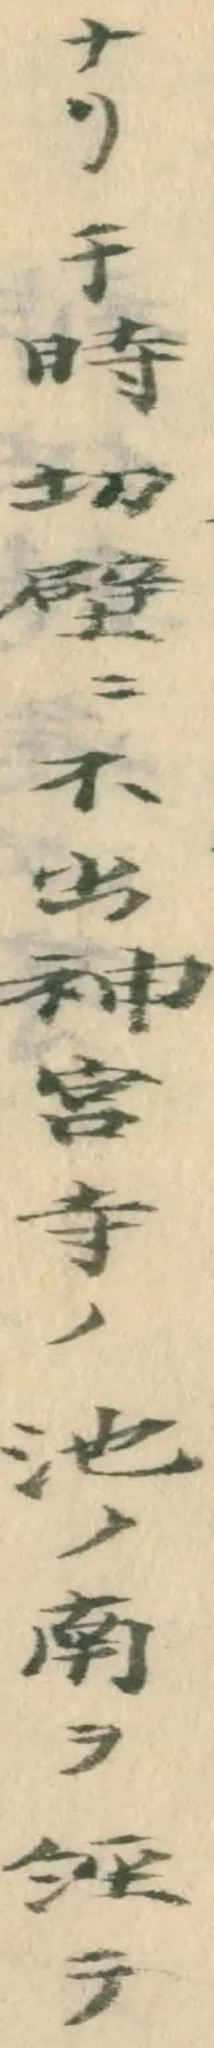ナリ于時切壁ニ不出神宮寺ノ池ノ南ヲ経テ
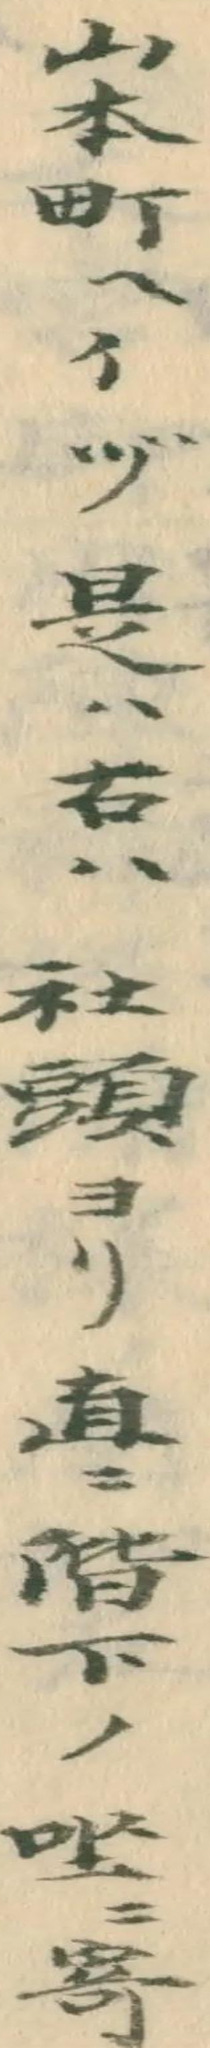山本町ヘイヅ是ハ古ハ社頭ヨリ直二階下ノ坐ニ寄
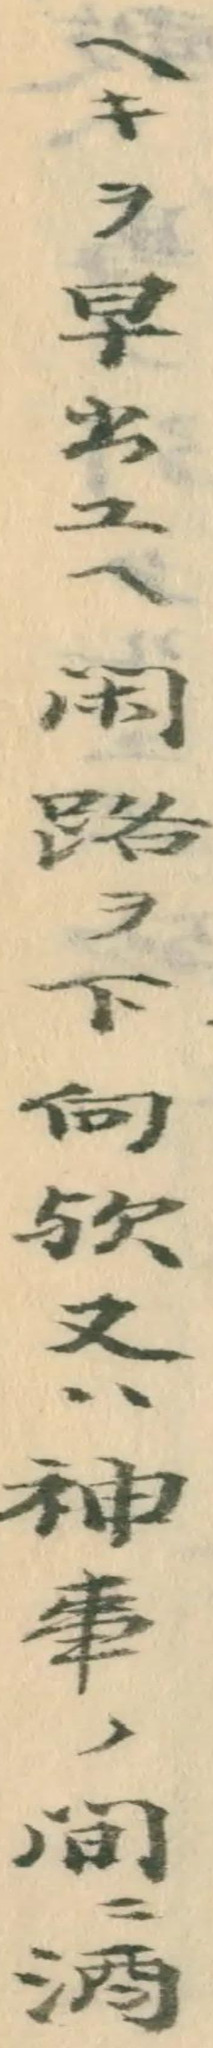ヘキヲ早出ユヘ閑路ヲ下向歟又ハ神事ノ間ニ酒

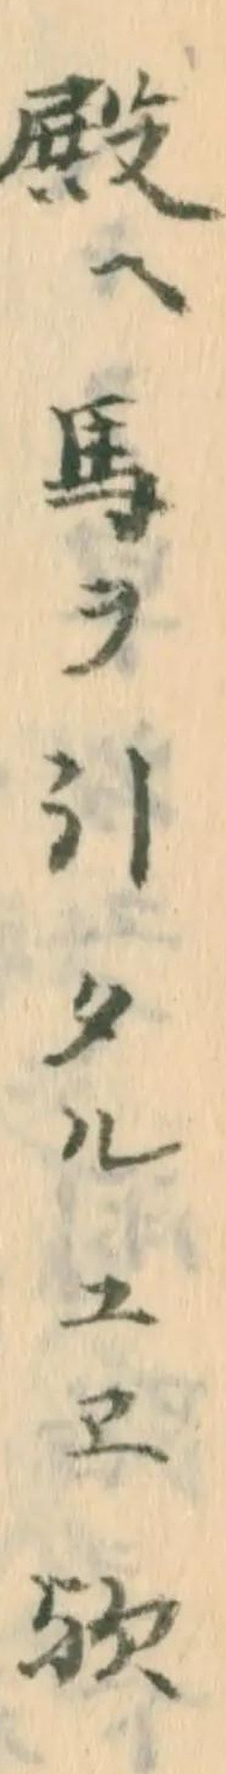殿ヘ馬ヲ引タルユヱ歟
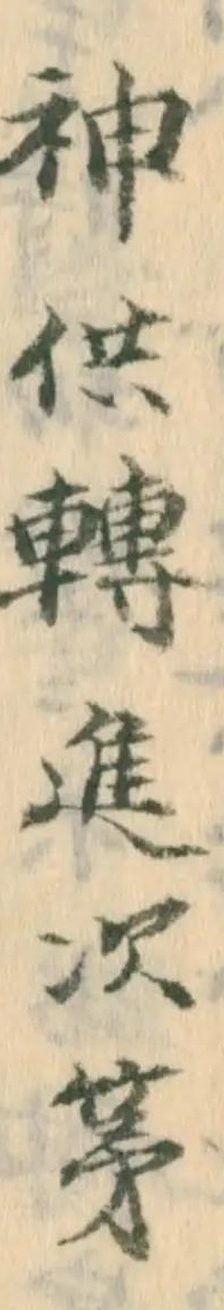神供転進次第
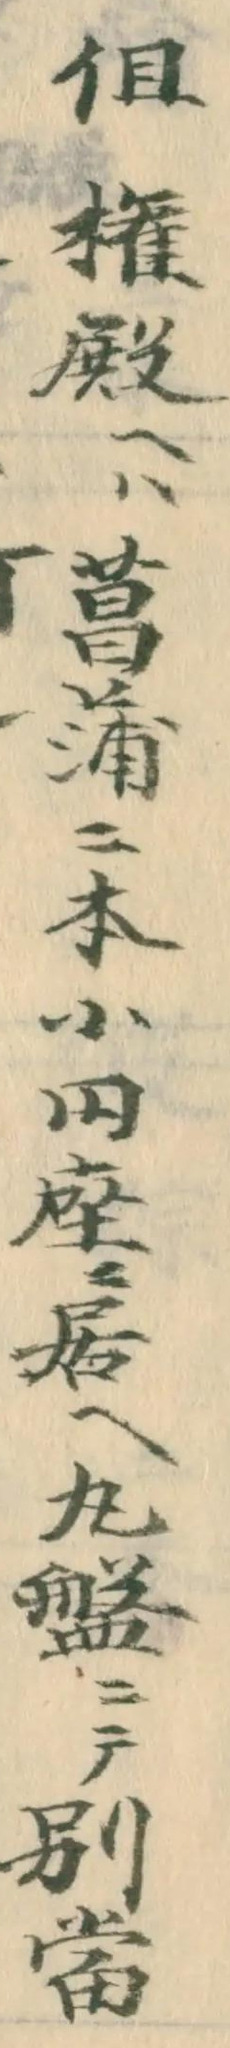但権殿ヘハ菖蒲ニ本小円座ニ居ヘ丸盤ニテ別当
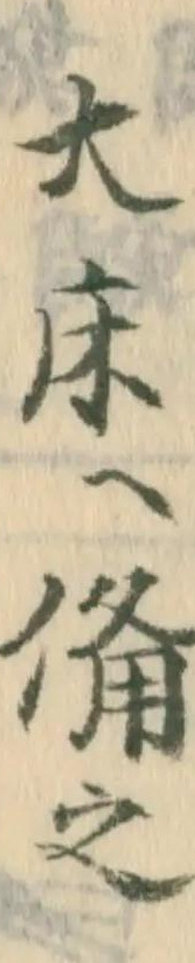大床へ備之
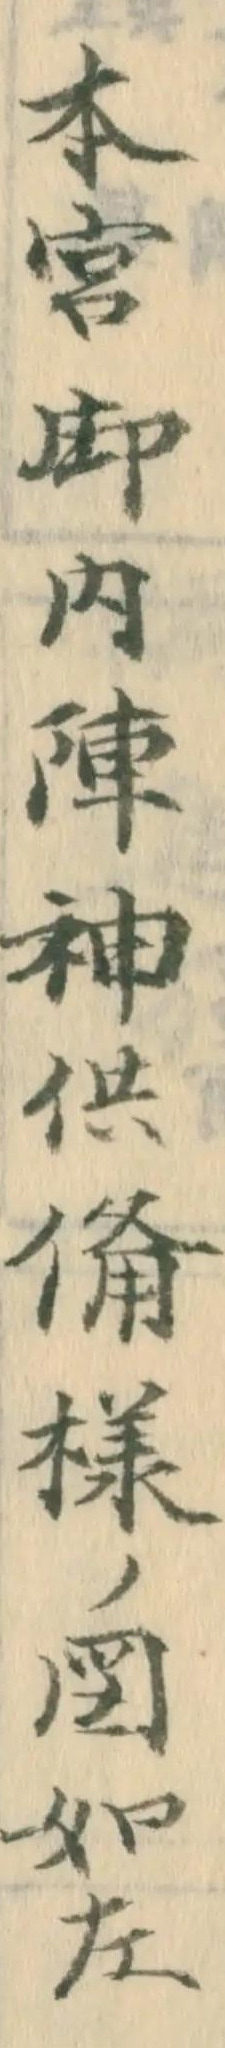本宮御内陣神供備様ノ図如左

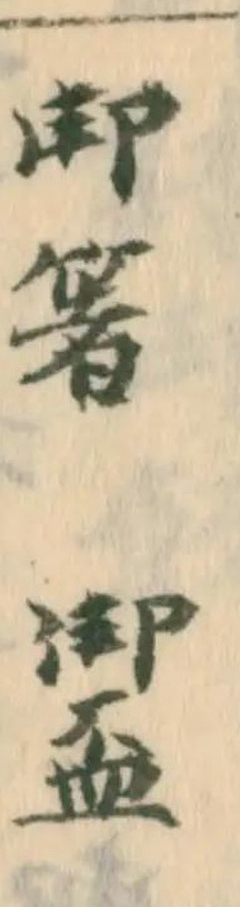御箸御盃
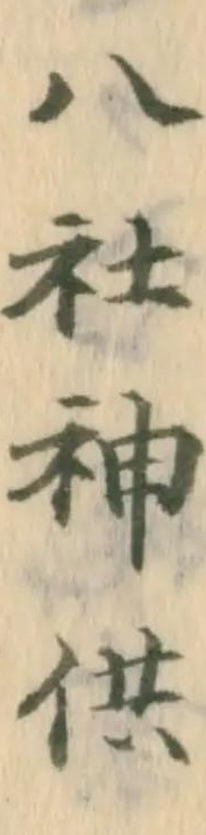八社神供
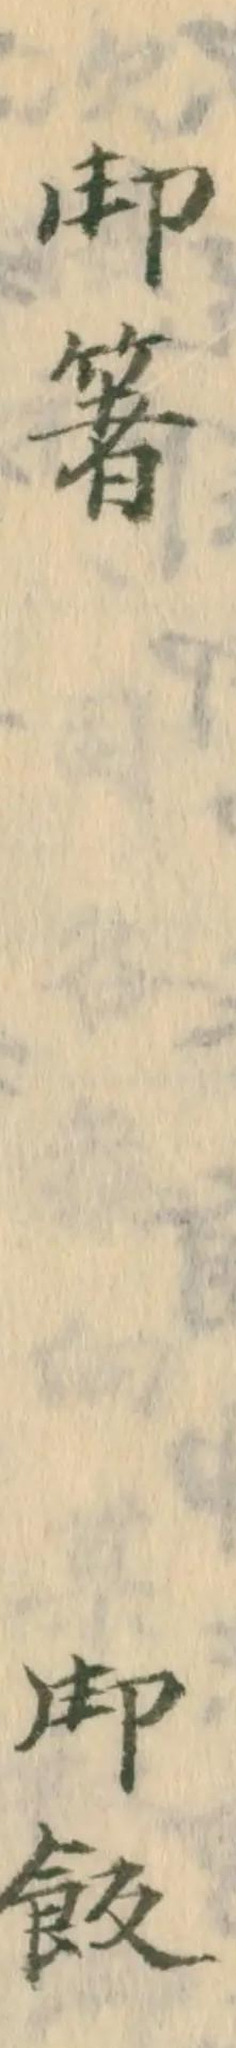御箸御飯
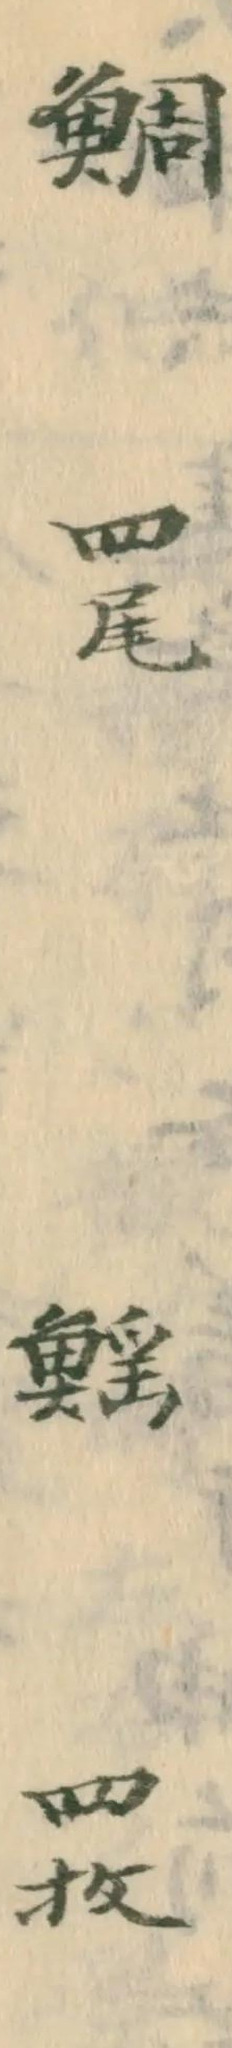鯛四尾鰩四枚
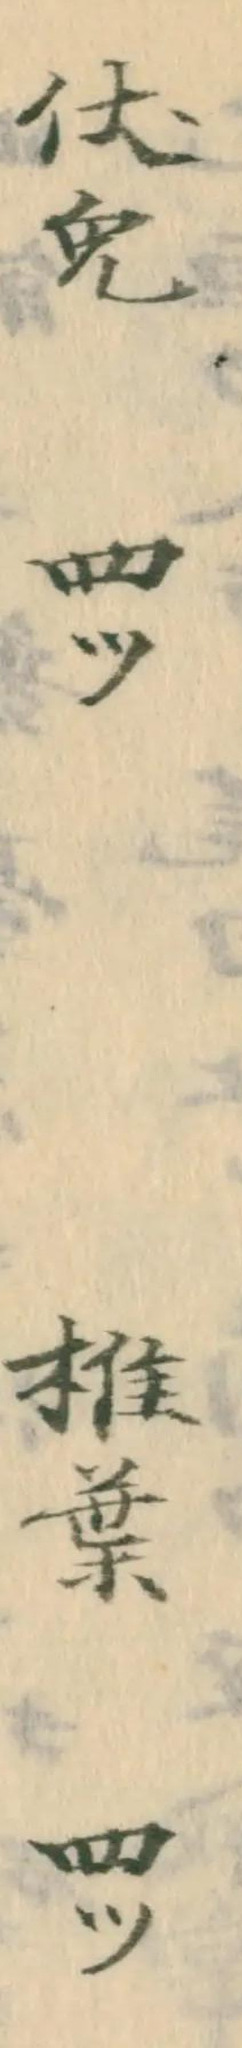伏兎四ツ椎葉四ツ
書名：賀茂社記録. 第5冊
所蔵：国立国会図書館 National Diet Library, JAPAN
